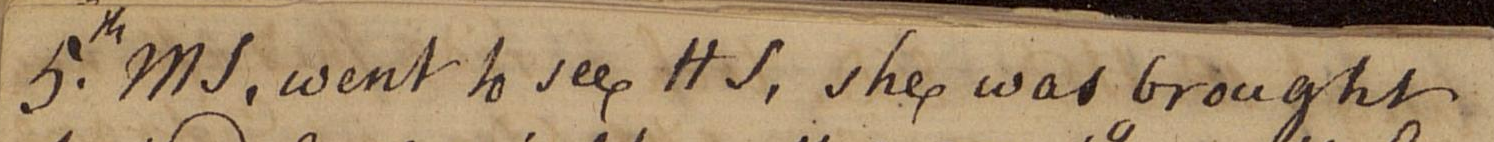5^th. MS. went to see HS, she was brought
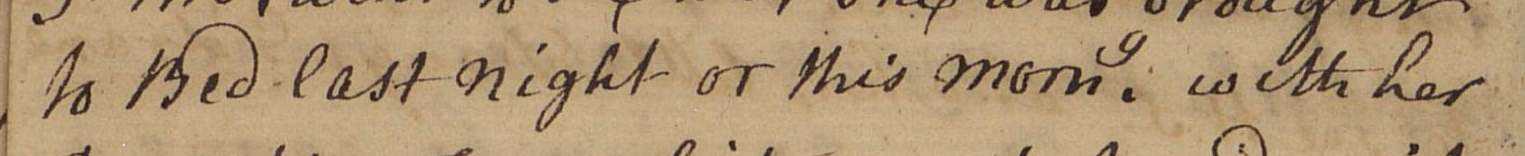to Bed last night or this morn^g. with her
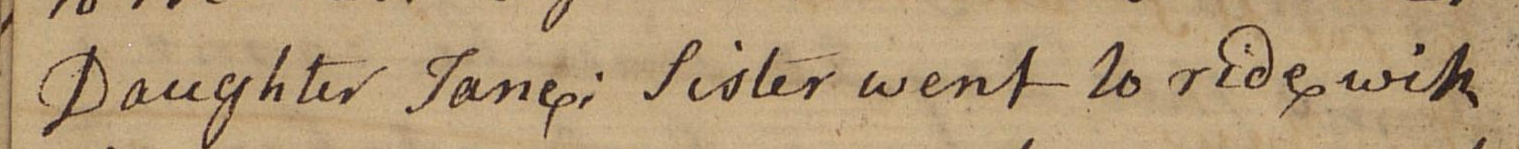Daughter Jane: Sister went to ride with
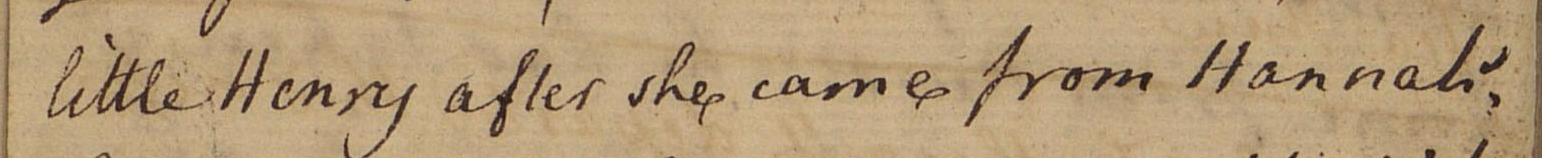little Henry after she came from Hannah^s.
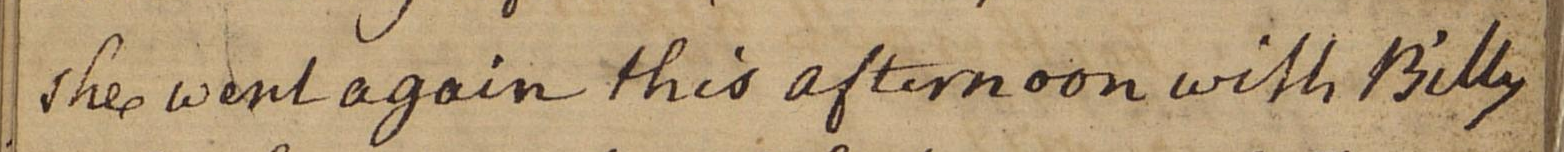she went again this afternoon with Billy
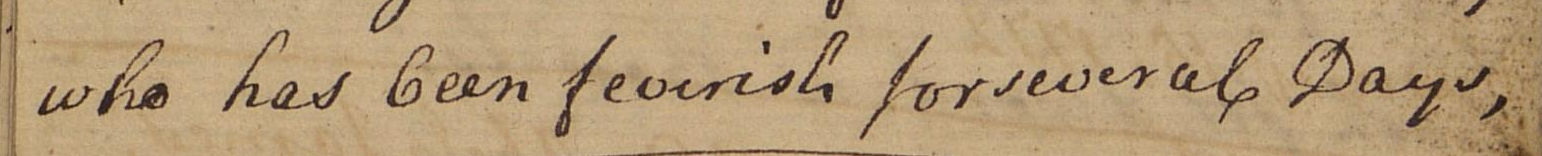who has been feverish for several Days,
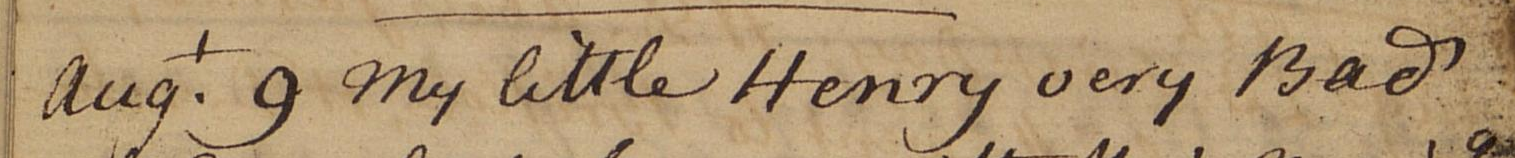Aug^t. 9 My little Henry very Bad
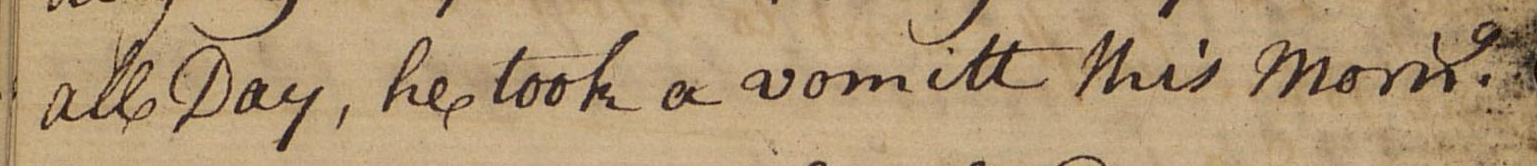all Day, he took a vomitt this morn^g.
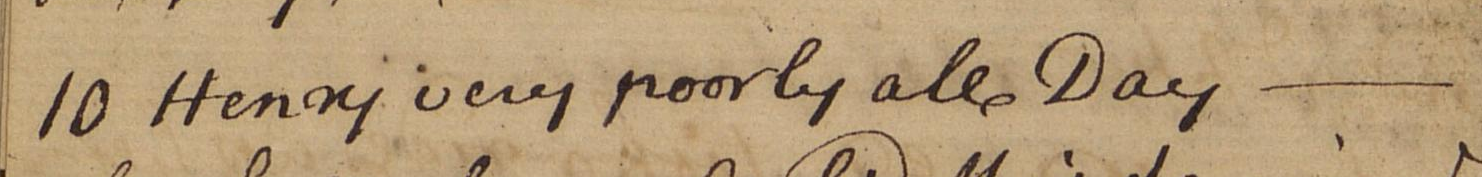10 Henry very poorly all Day-
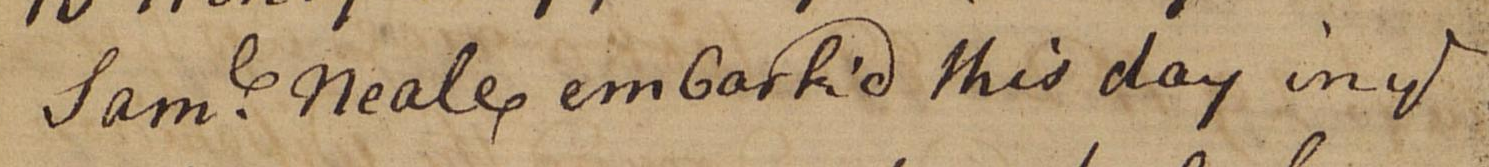Sam^l. Neale embark'd this day in y^e
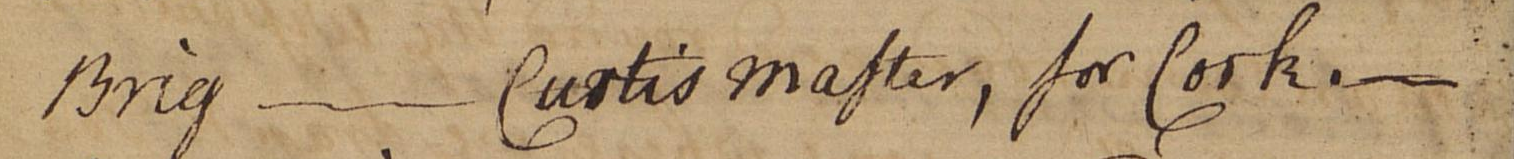Brig- Curtis Master, for Cor k-
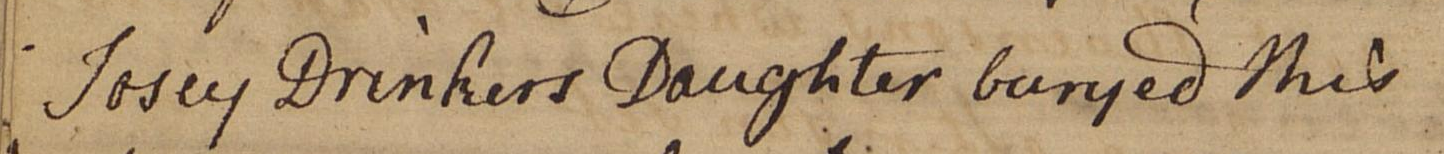Josey Drinkers Daughter buryed this
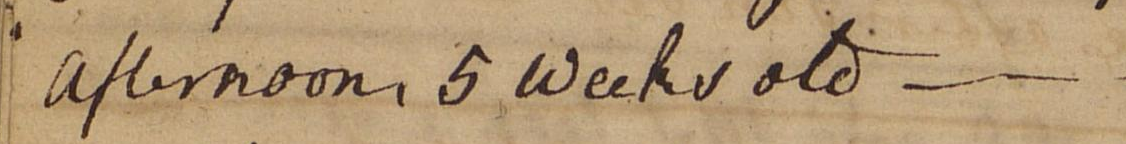Afternoon, 5 Weeks old-
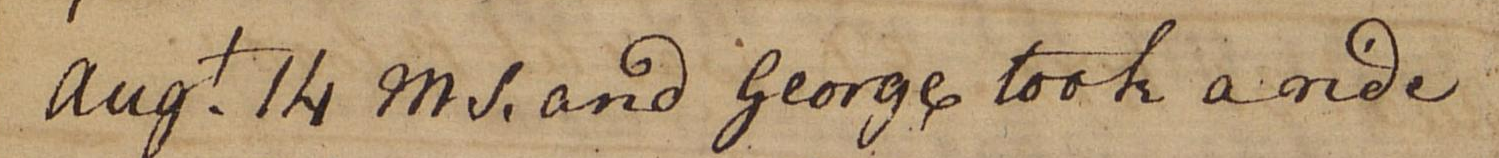Aug^t. 14 MS. and George took a ride
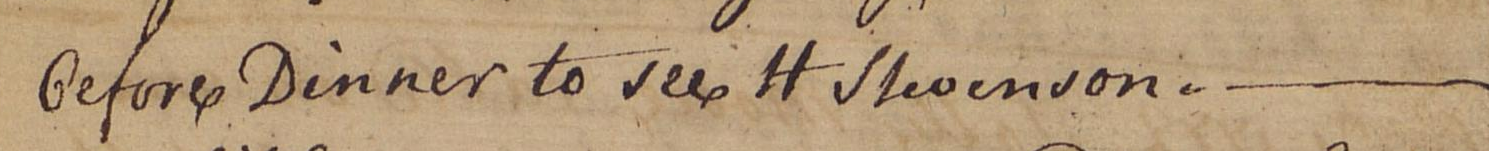before Dinner to see H Stevenson.-
